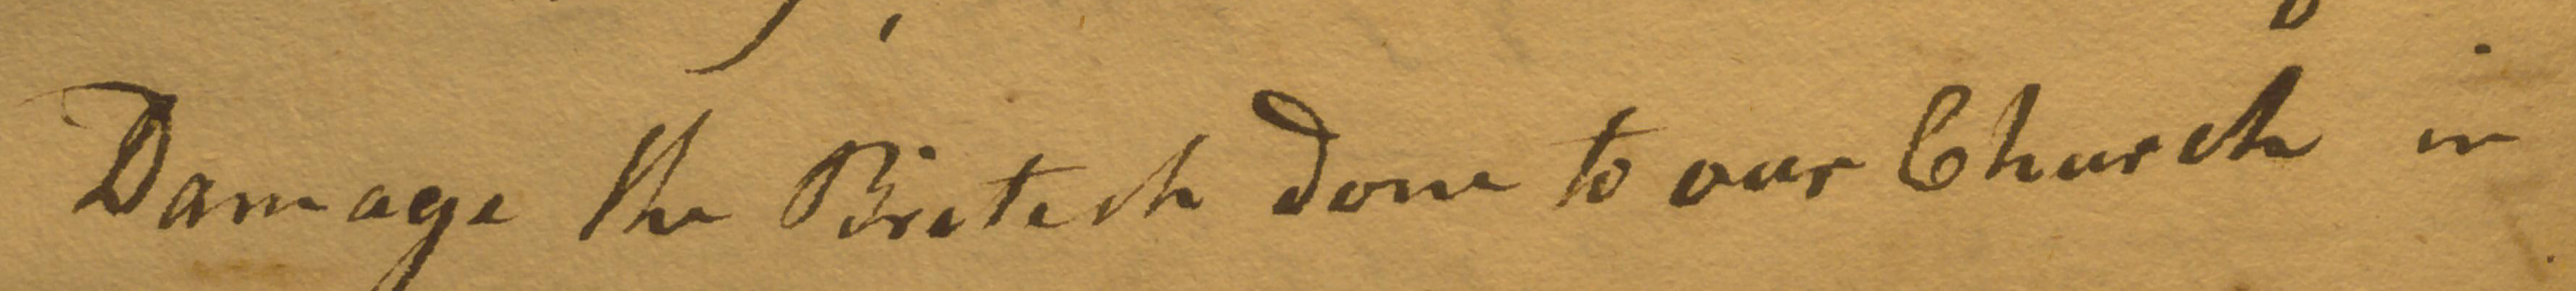Damage the British done to our Church in
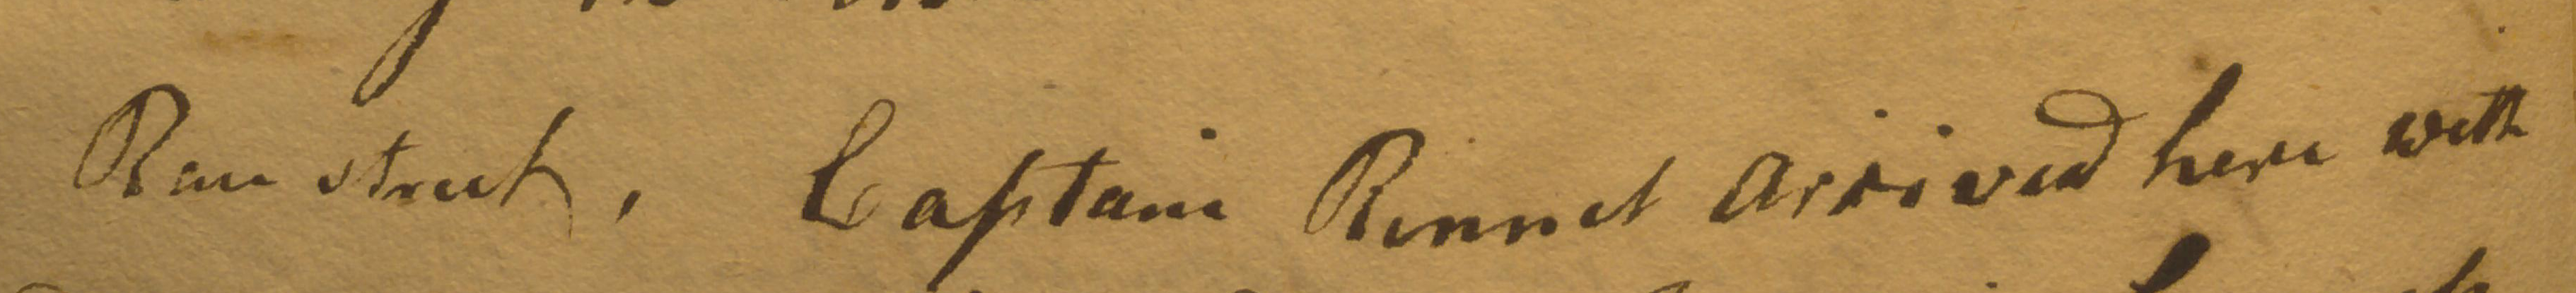Race street, Captain Rinnet arrived here with
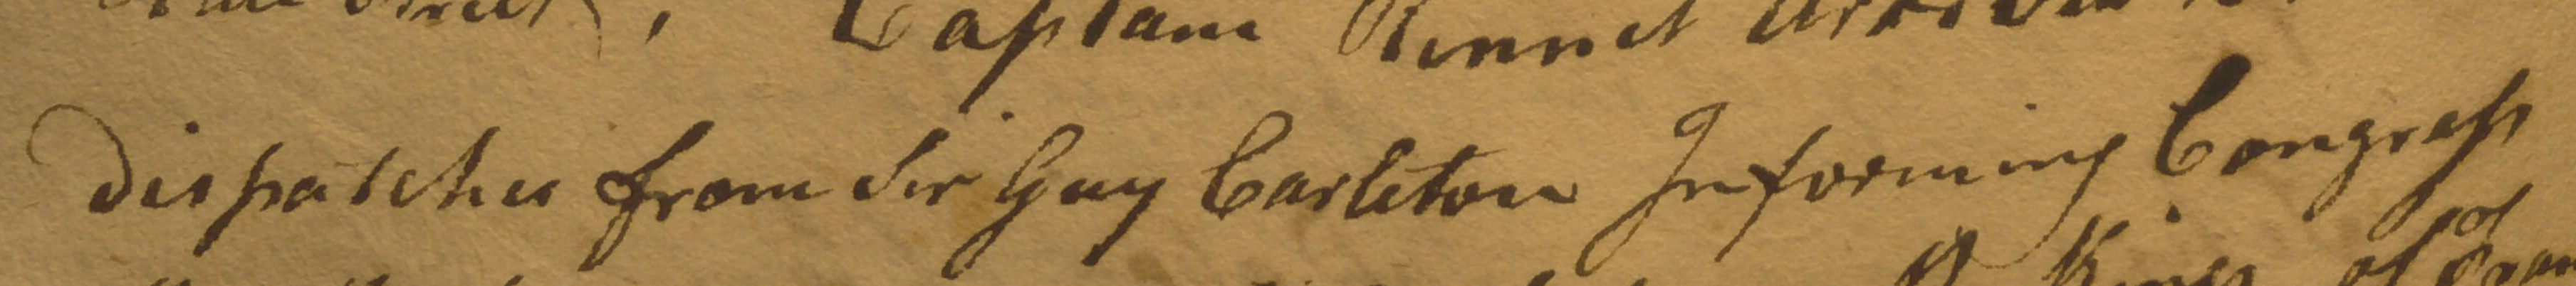dispatches from Sir Guy Carleton Informing Congress
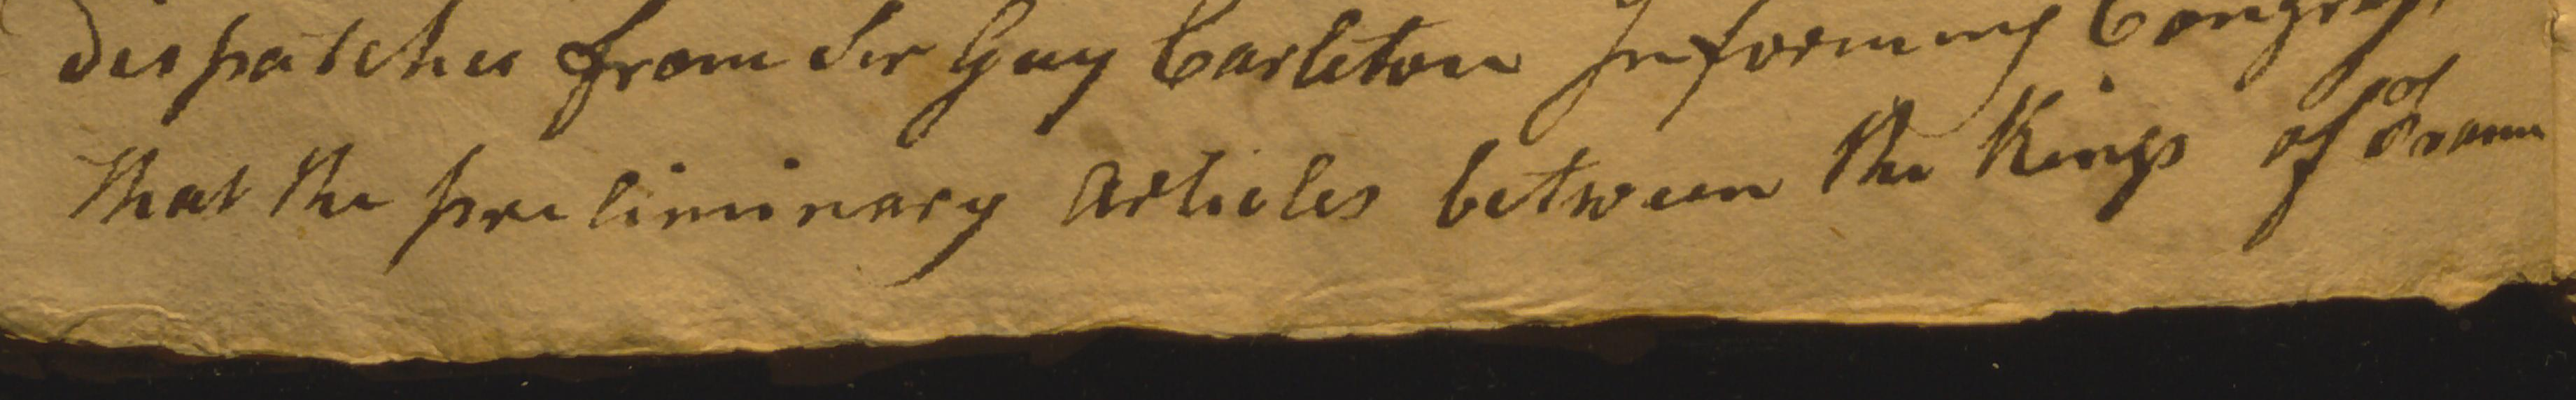that the preliminary articles between the King of France
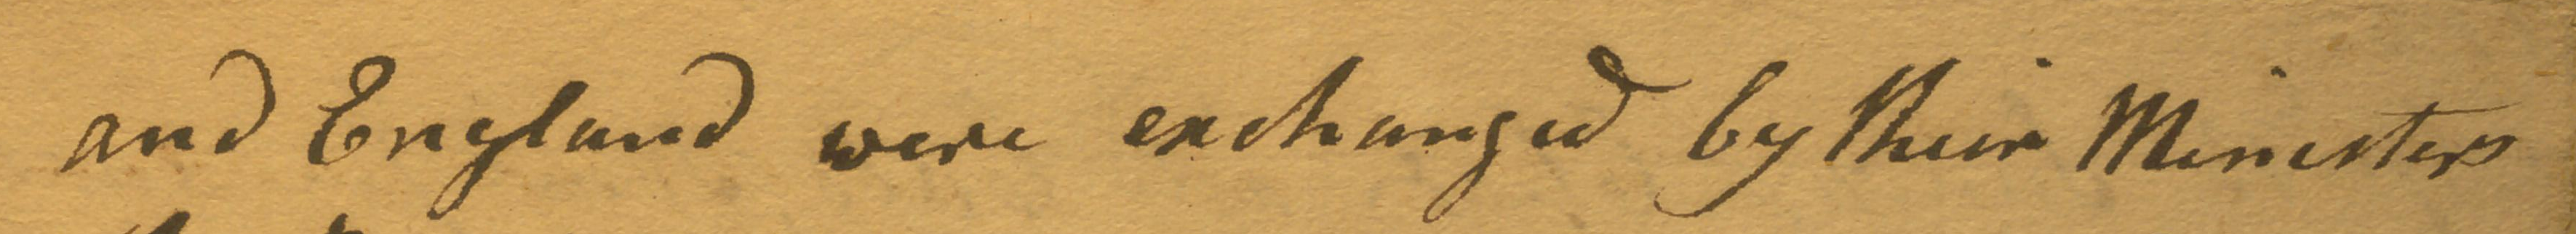and England were exchanged by their Ministers
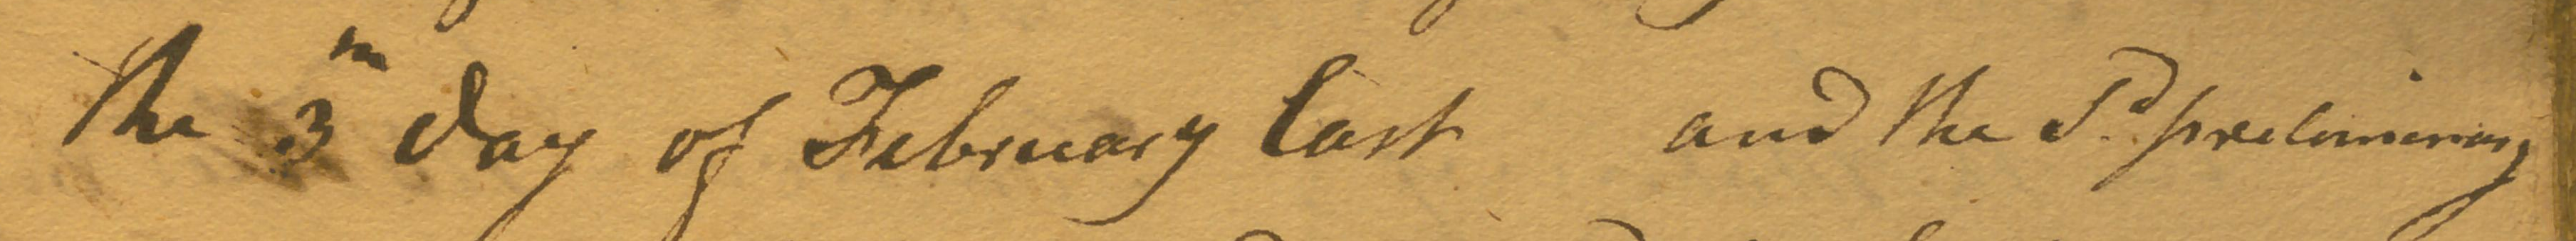The 3^th day of February last and the s^d. preliminary
